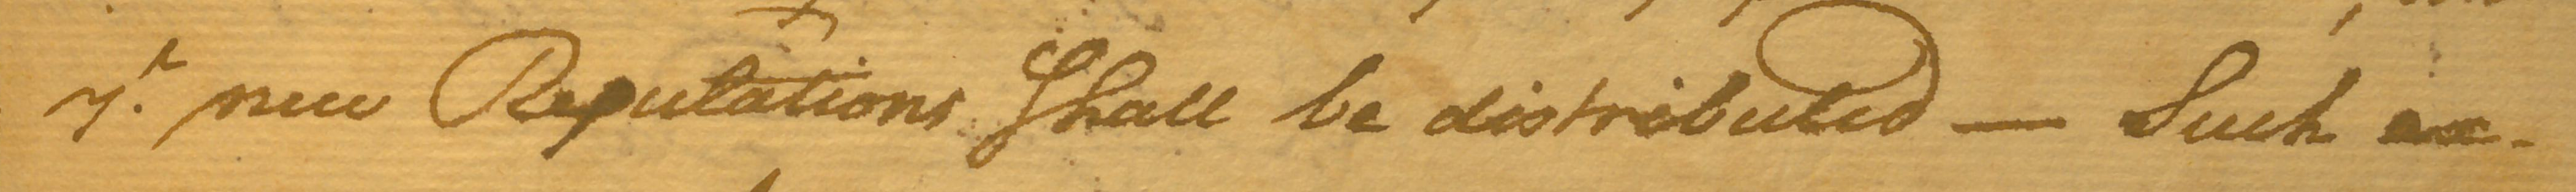y^e. new Reputations shall be distributed- Such ex-
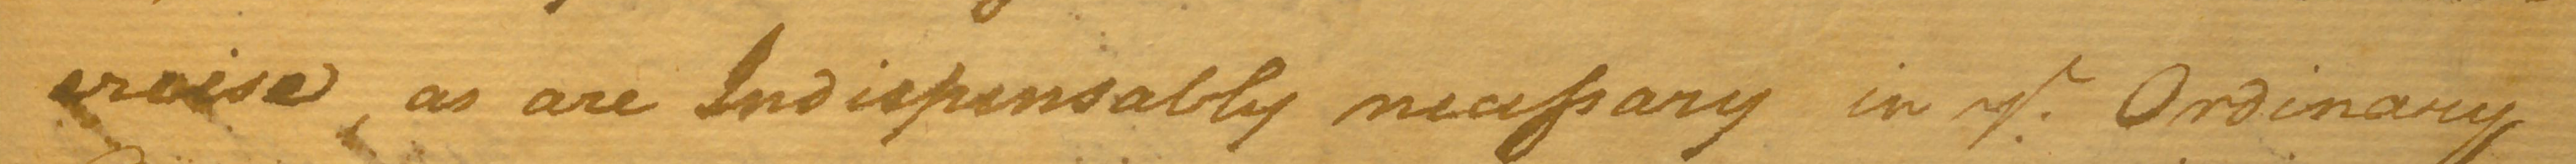ercise as are Indispensably necessary in y^e. Ordinary
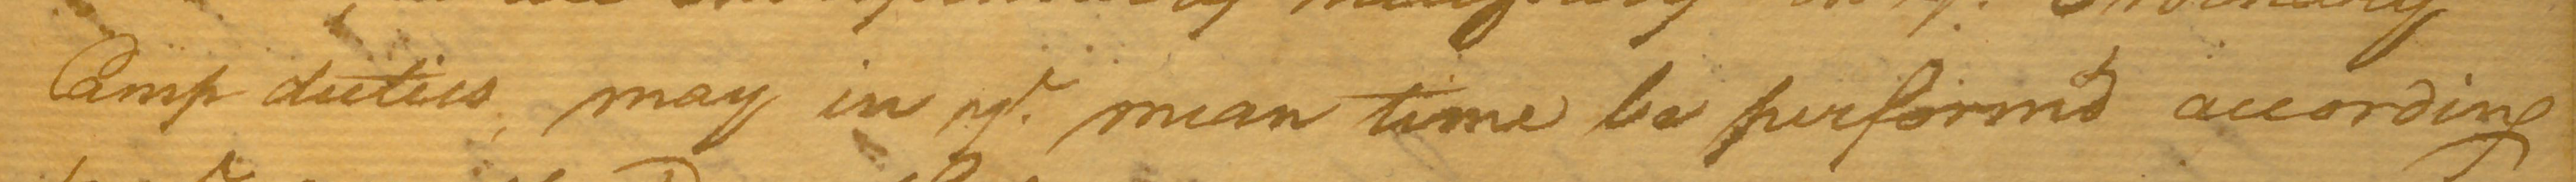Camp duties may in y^e. mean time be perform'd according
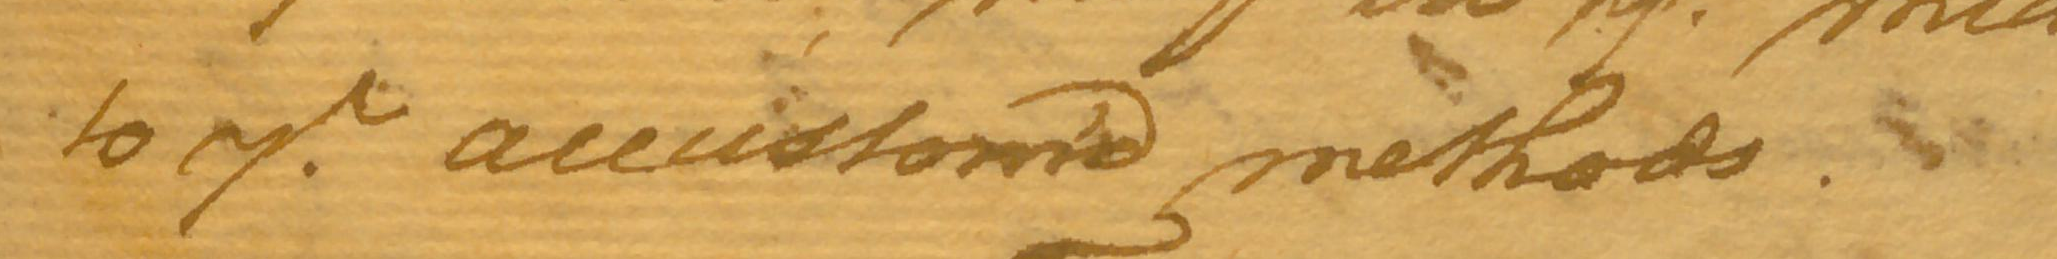to y^e. accustom'd methods.
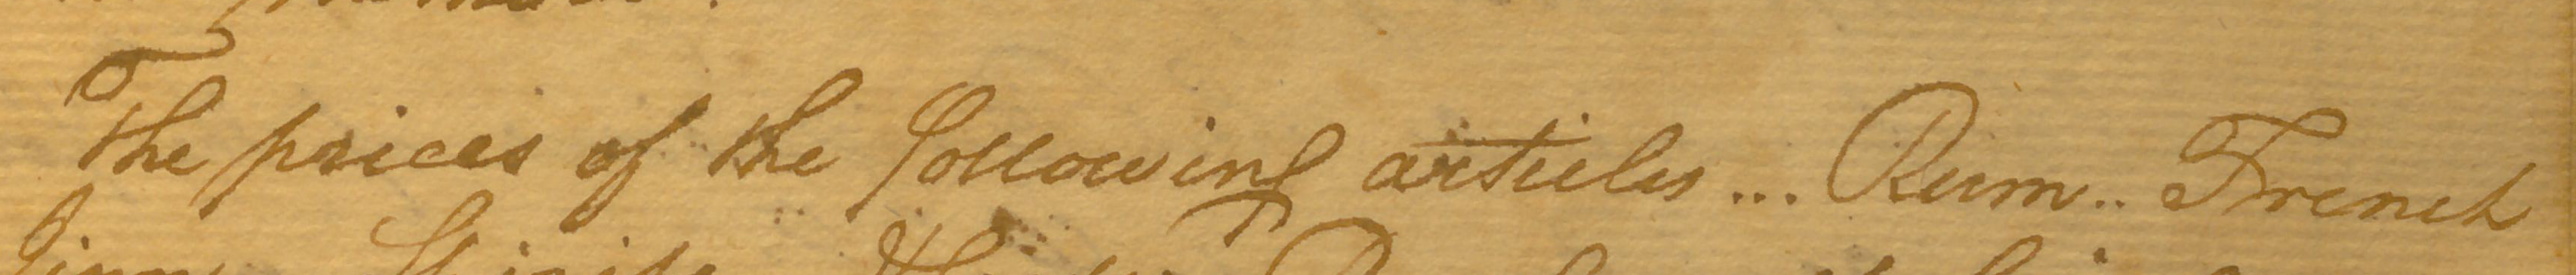The prices of the following articles... Rum.. French
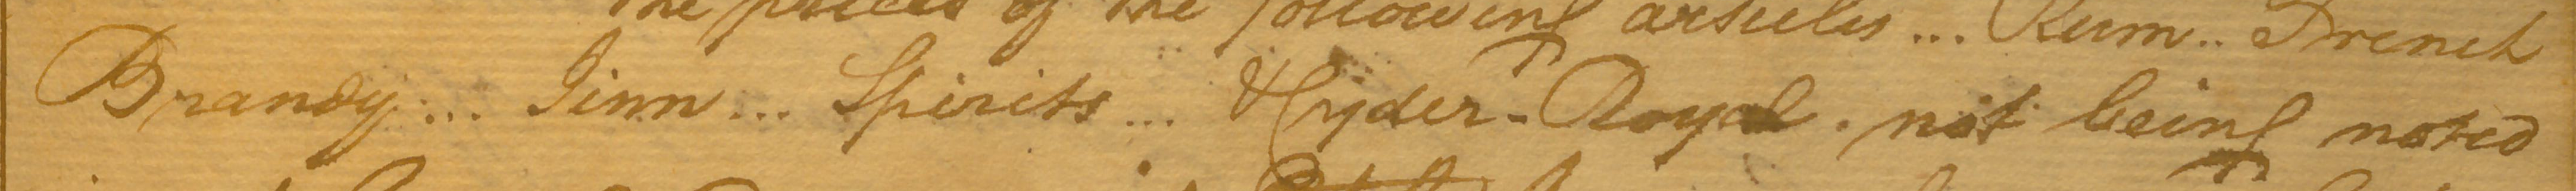Brandy... Jinn... Spirits... & Cyder-Royal not being noted
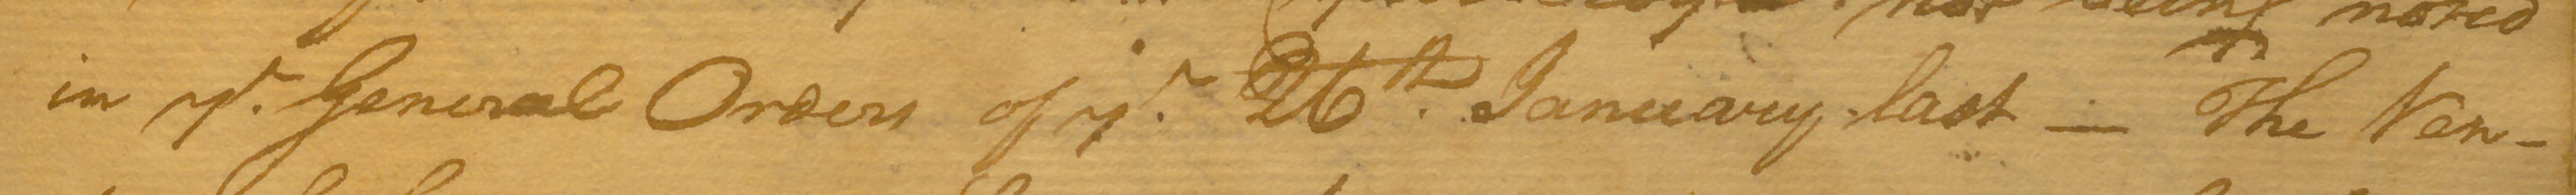in y^e. General Orders of y^e. 26^th. January last- The Ven-
